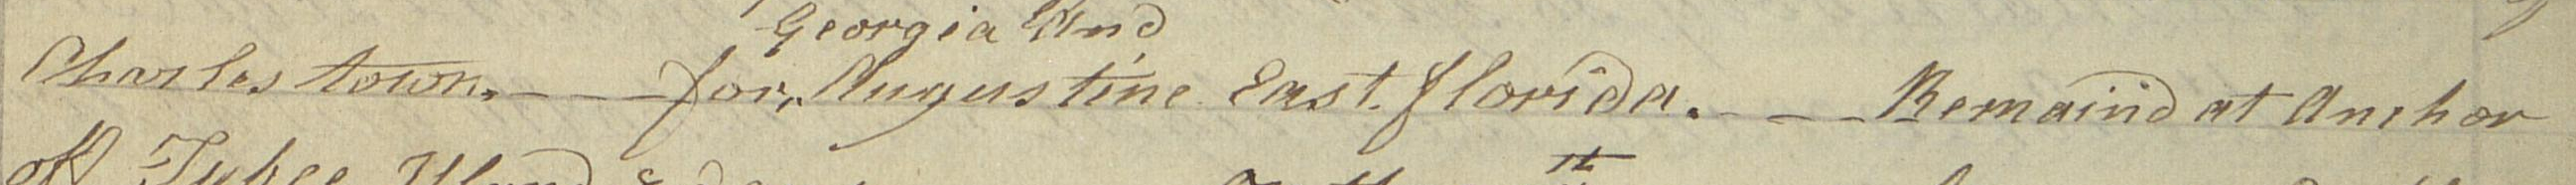Charles town. for ^ Augustine East Florida. Remaind at Anchor
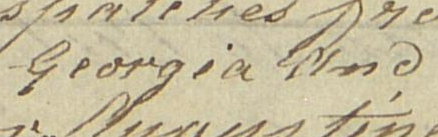Georgia And
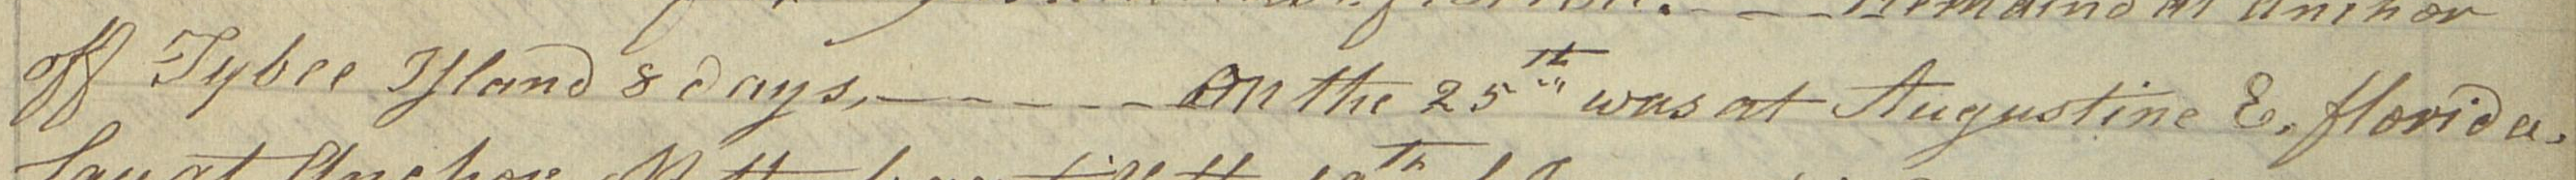off Tybee Island 8 days, On the 25^th. was at Augustine E. Florida
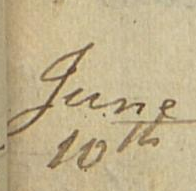June
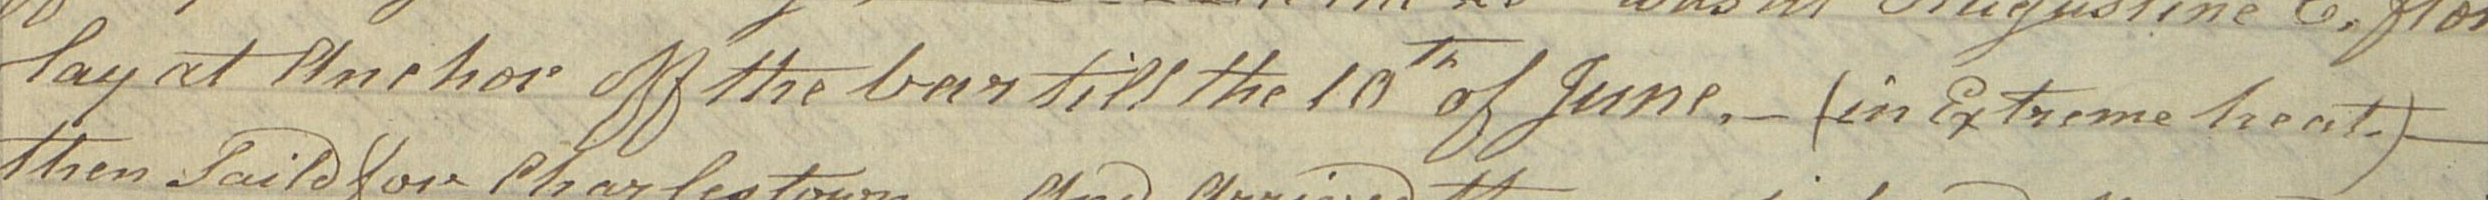lay at Anchor off the bar till the 10^th of June. (in Extreme heat.)
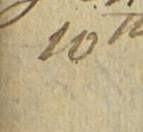10^th
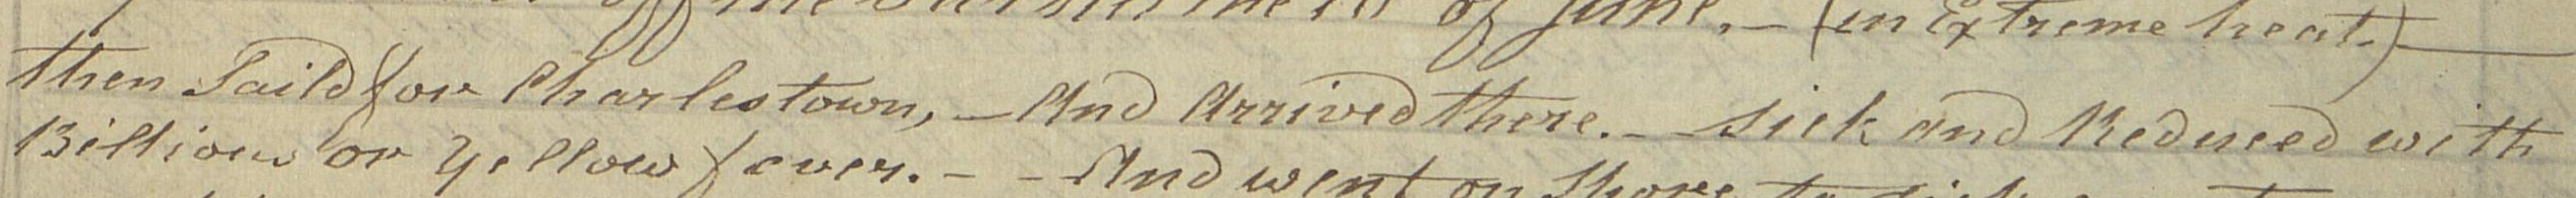then saild for Charlestown, And Arrived there. sick and Reduced with
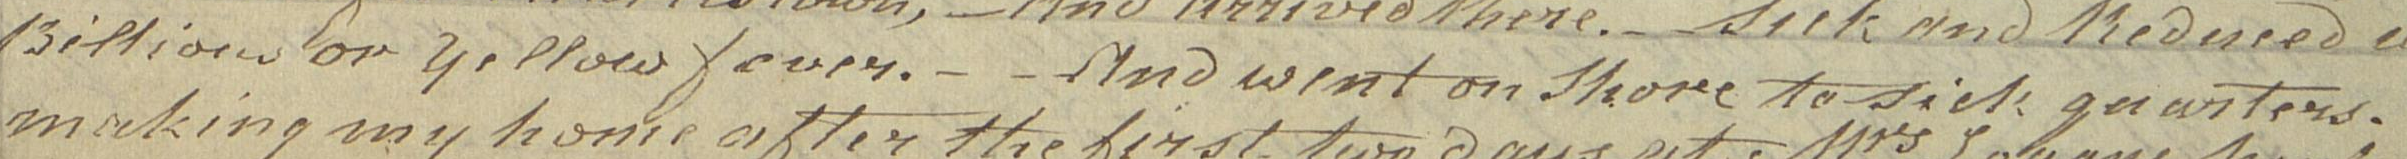Billions or yellow fever. And went on shore to sick quarters.
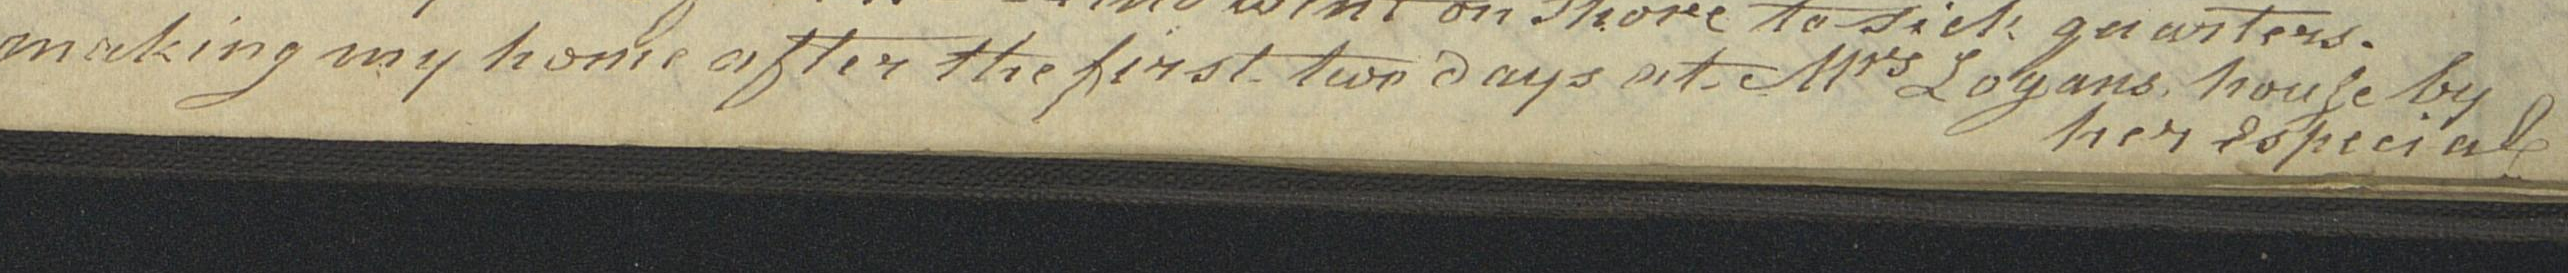making my home after the first two days atM^rs Logans house by
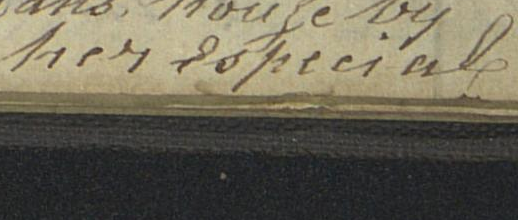her Especial
